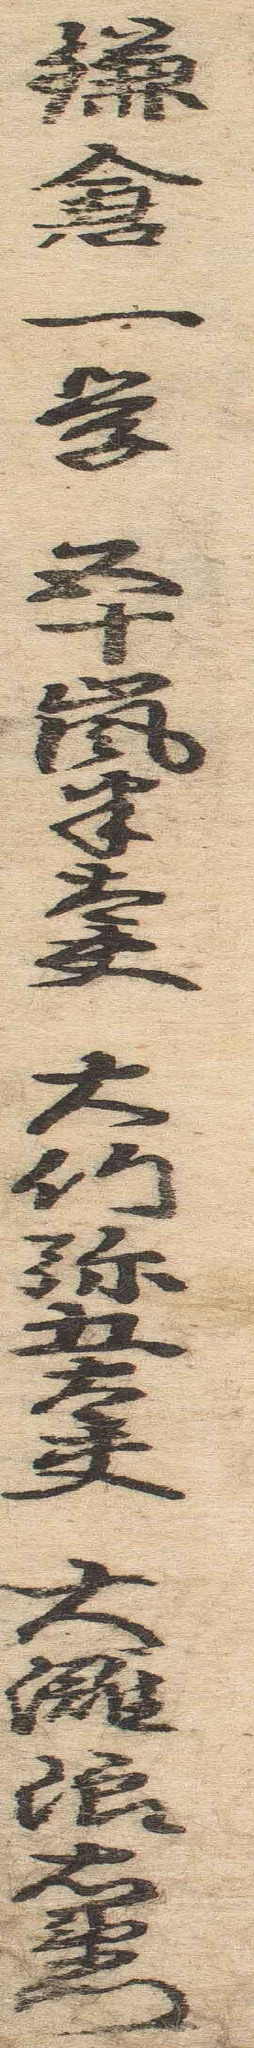鎌倉一学五十嵐半太夫大竹弥五太夫大灘浪右衛門
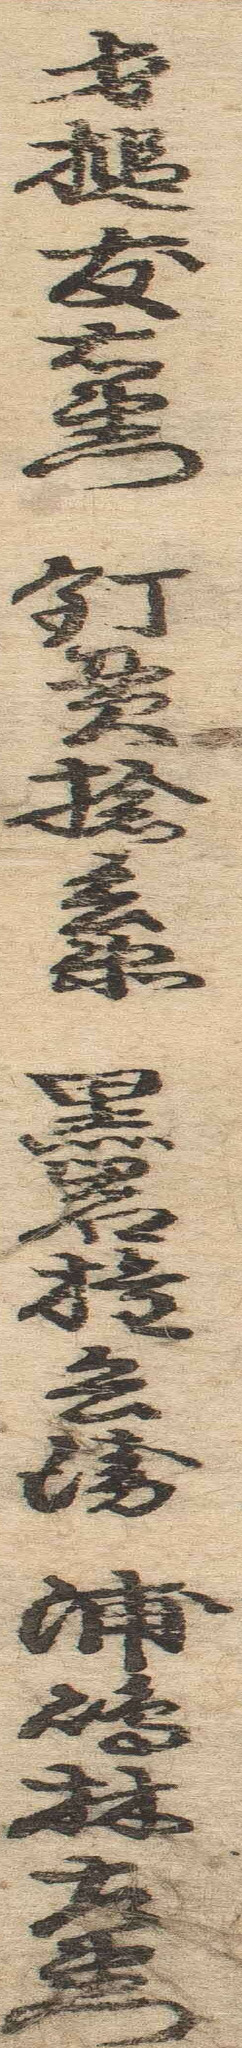才槌友右衛門釘貫拾兵衛黒岩権兵衛浦嶋林左衛門
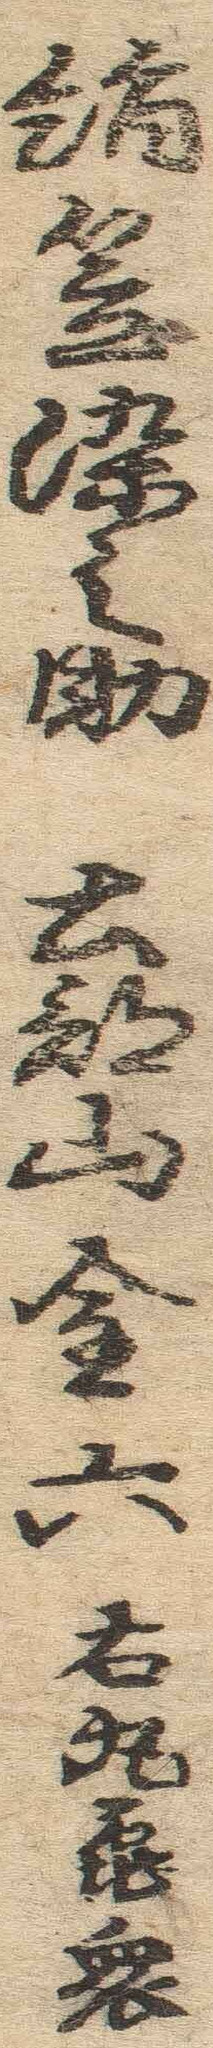絹笠染之助土部山金六右丸亀衆

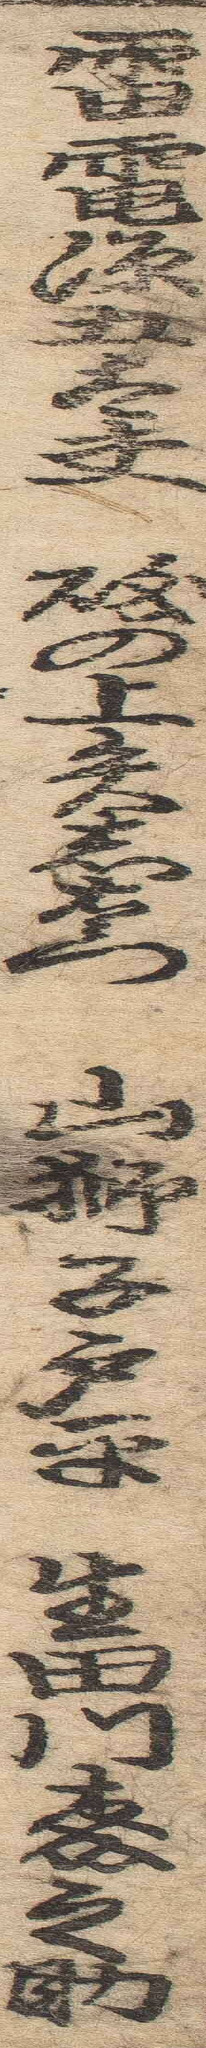雷電源五太夫磯の上矢志右衛門山獅子戸平生田川森之助
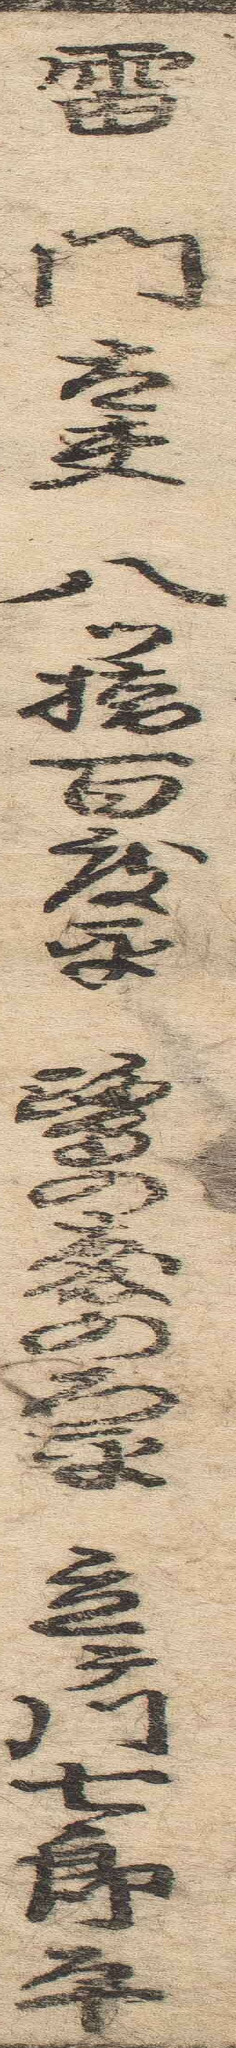雷門太夫八ツ橋百度平鷲の森の万平立テ川七郎平
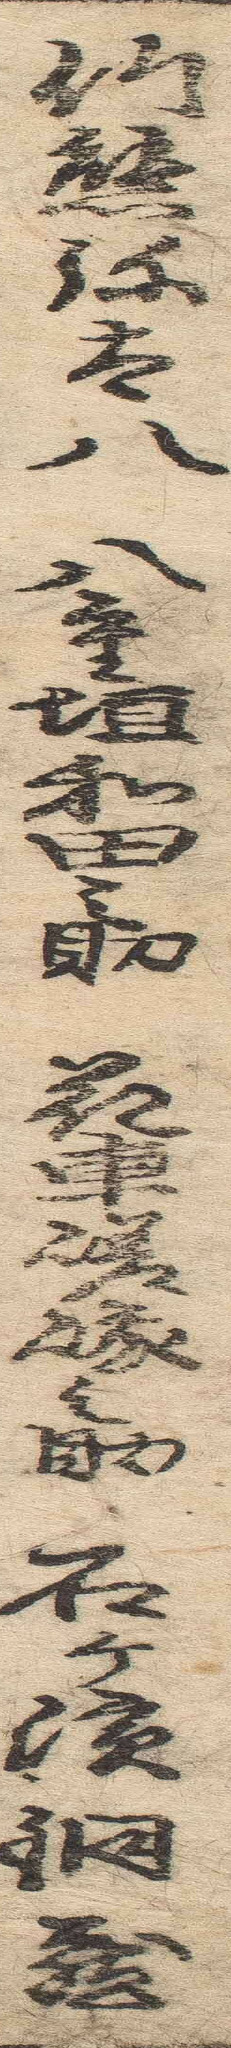竹熊弥太八八重垣和田之助花車磋磯之助石ケ浜銅蔵
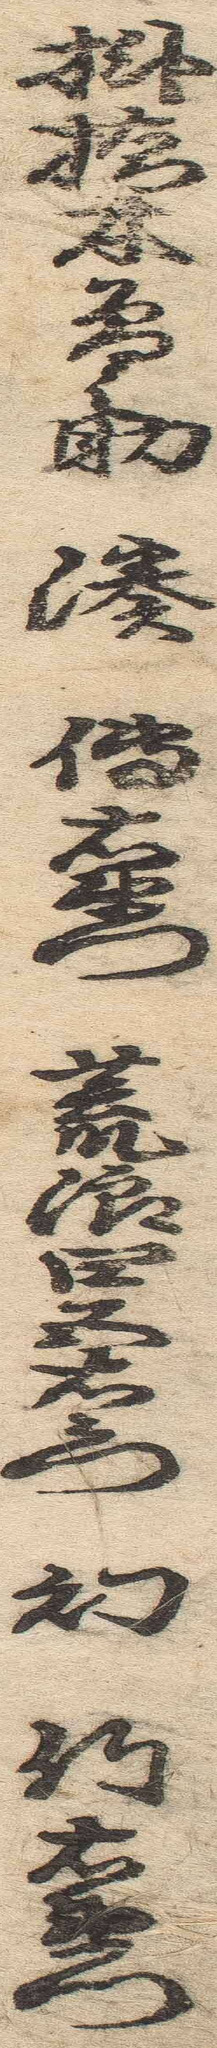掛橋木曽之助湊伝右衛門荒浪四五右衛門幻竹右衛門
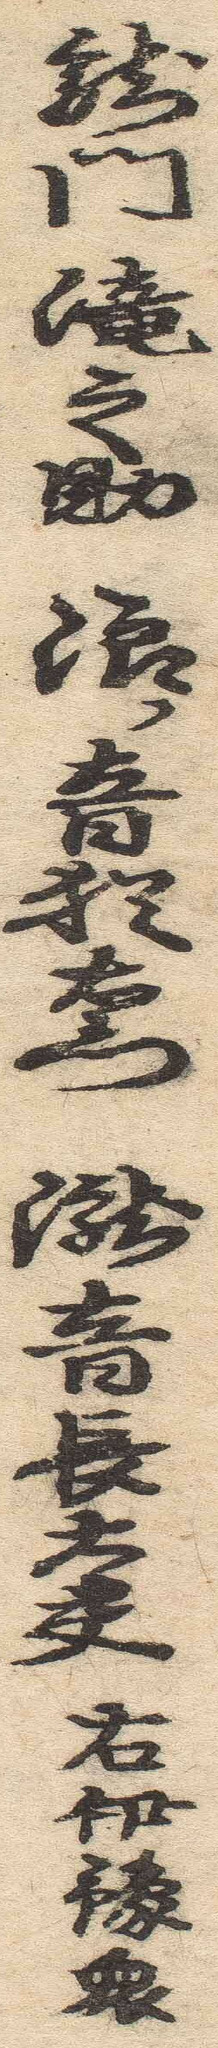龍門滝之助浪ノ音於右衛門瀧音長太夫右伊予衆
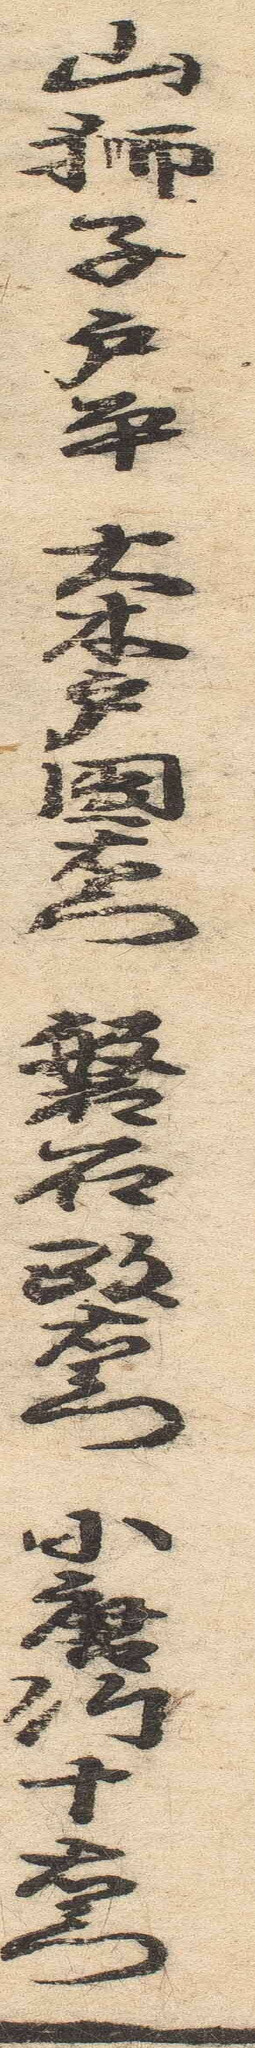山獅子戸平大木戸団右衛門磐石政右衛門小唐竹十右衛門
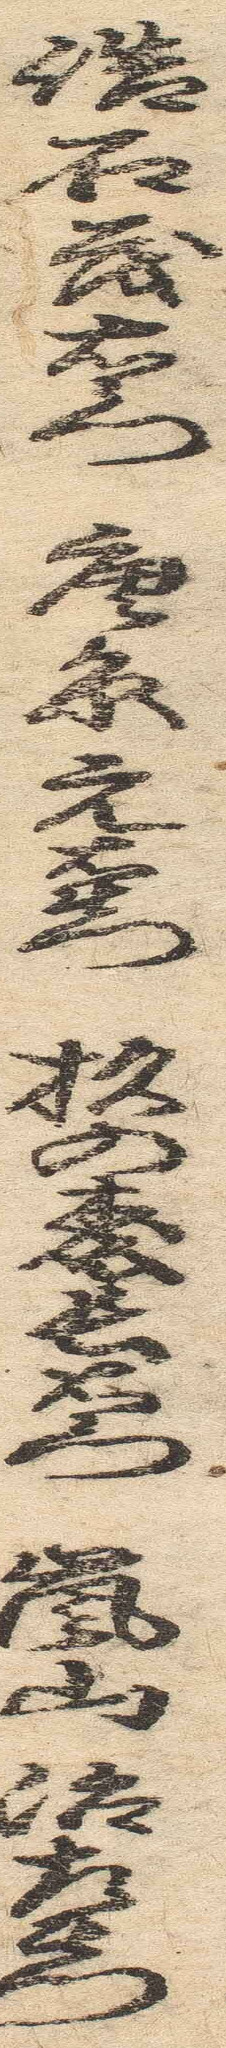詰石茂右衛門唐糸元右衛門杉の森長右衛門嵐山清左衛門
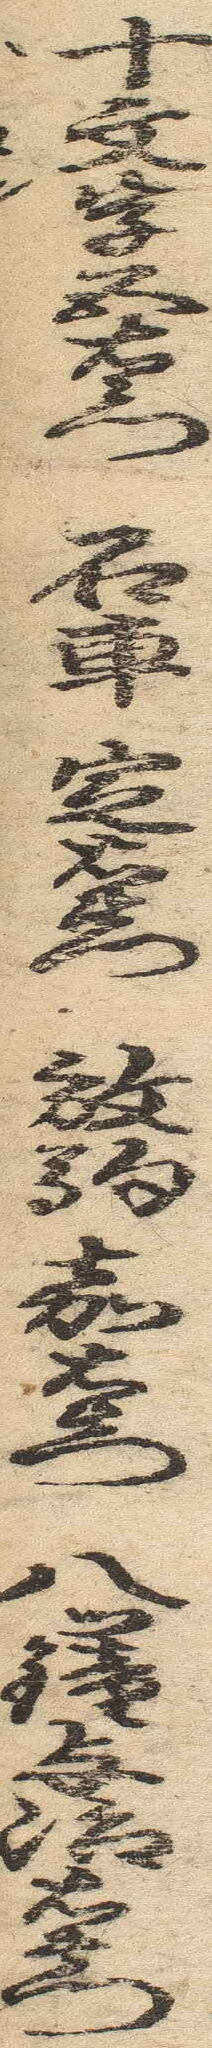十文字五右衛門石車定右衛門放駒嘉右衛門八ツ鏡与治右衛門
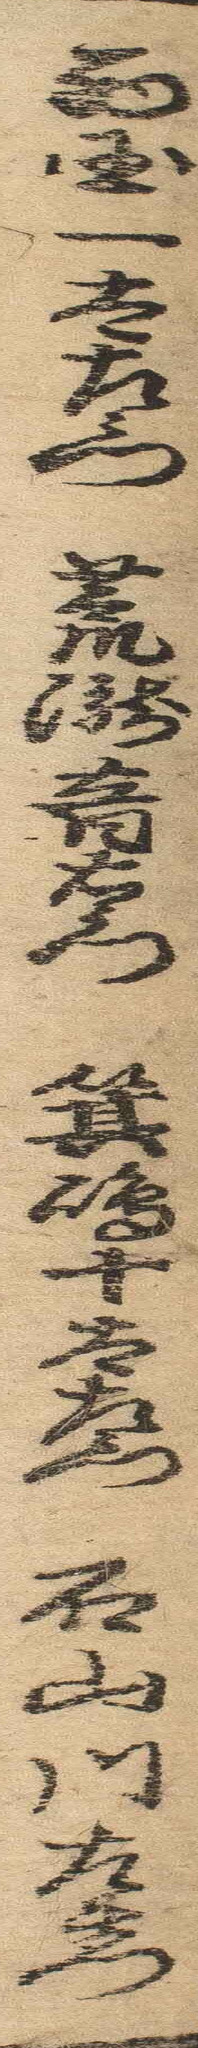両國一太左衛門荒瀧音右衛門簑嶋十太左衛門石山門左衛門
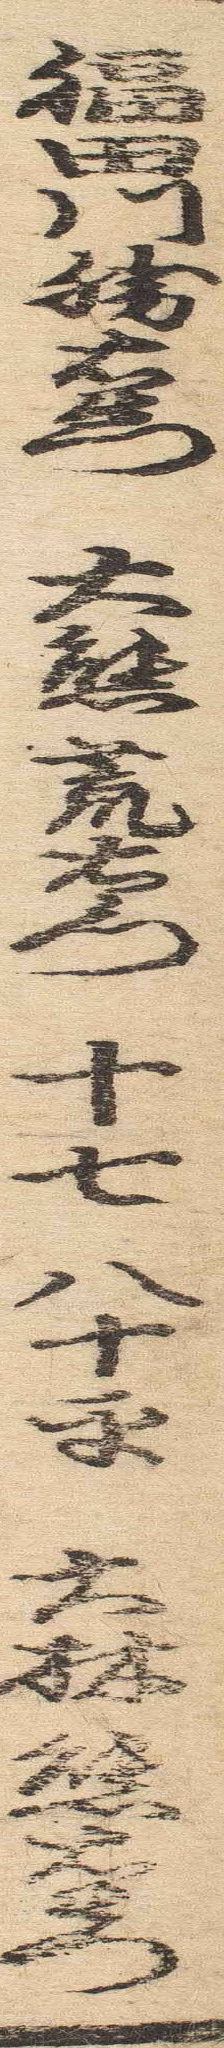福田川勝右衛門大熊荒右衛門十七八十平大林熊右衛門
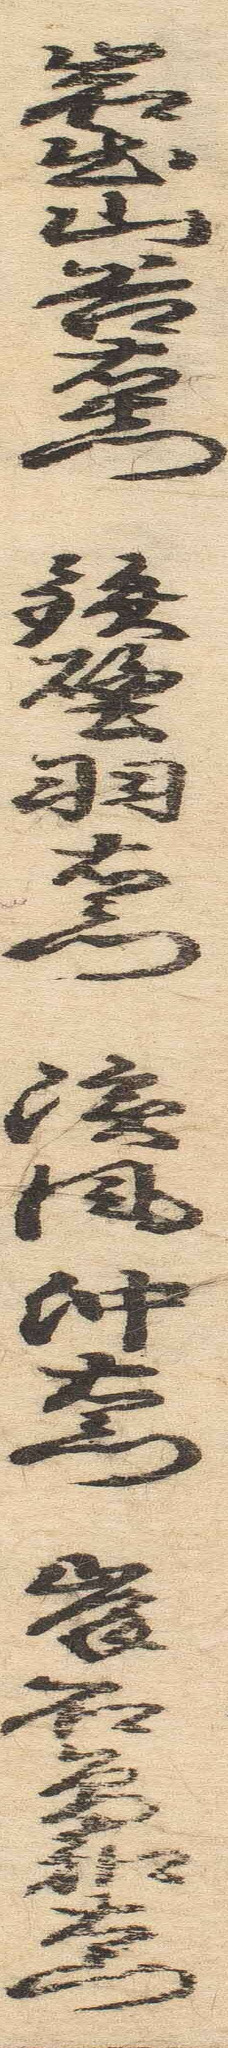岩出山谷右衛門鉄壁羽右衛門湊風沖右衛門峰石曾和右衛門
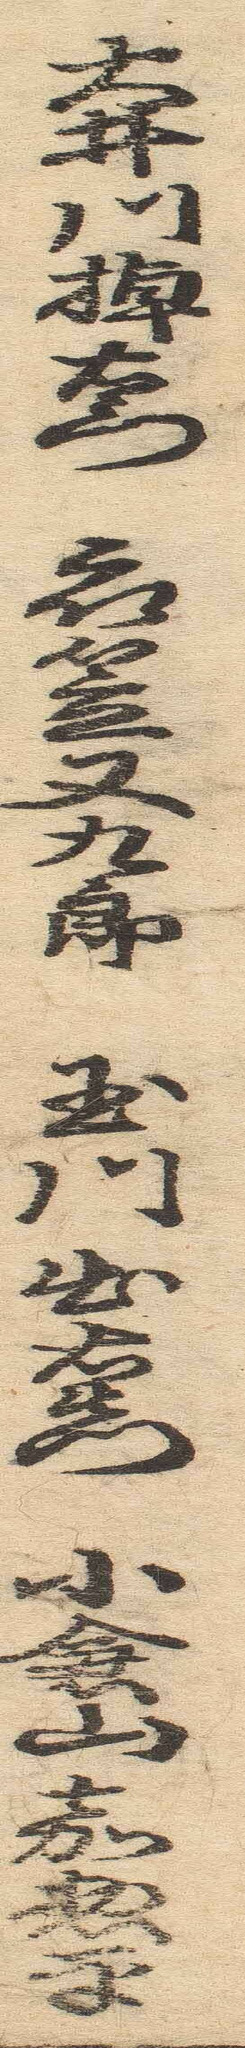大井川棹右衛門衣笠又九郎玉川出右衛門小倉山嘉惣平
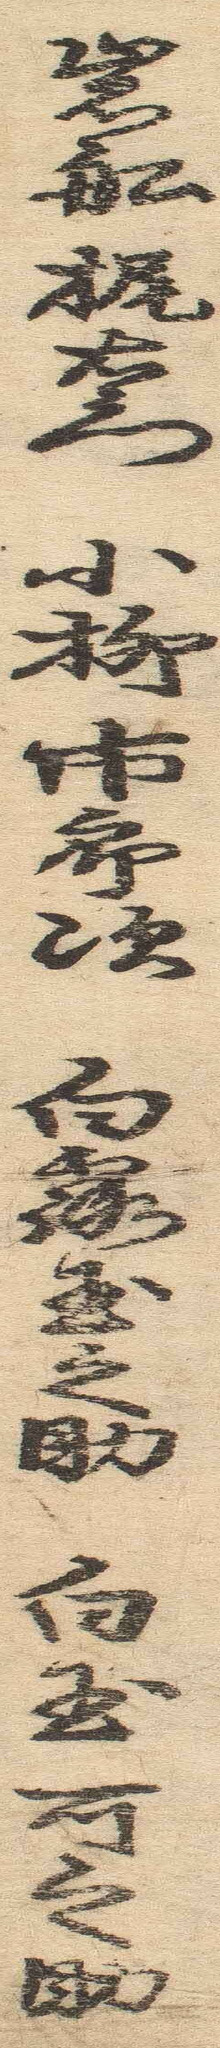岩船梶右衛門小柳市郎次白露玉之助白玉万之助
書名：古今相撲大全
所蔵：東京学芸大学附属図書館 国文学研究資料館
